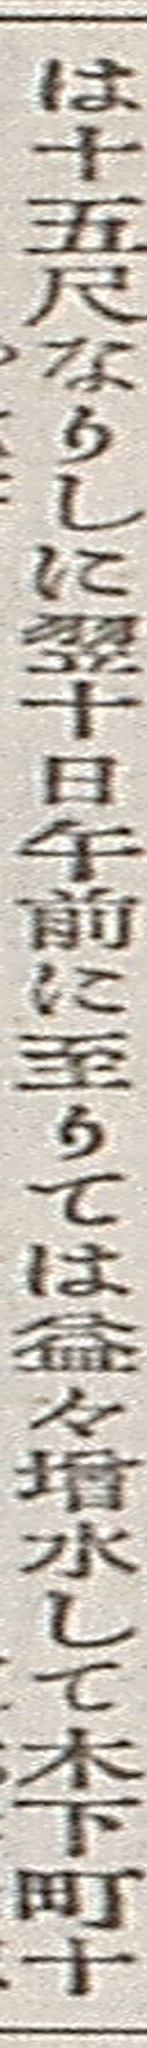は十五尺なりしに翌十日午前に至りては益々増水して木下町十
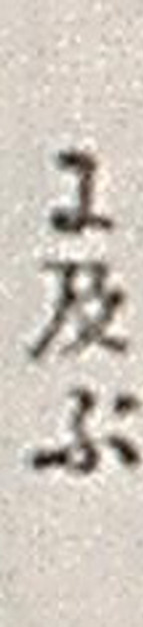に及ぶ
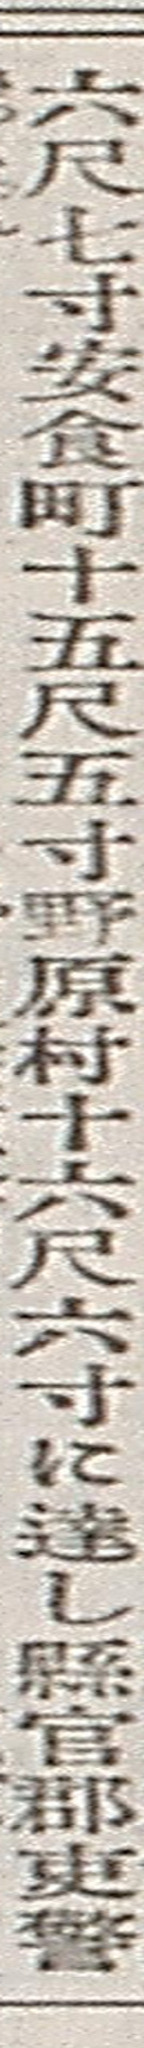六尺七寸安食町十五尺五寸野原村十六尺六寸に達し県官郡吏警
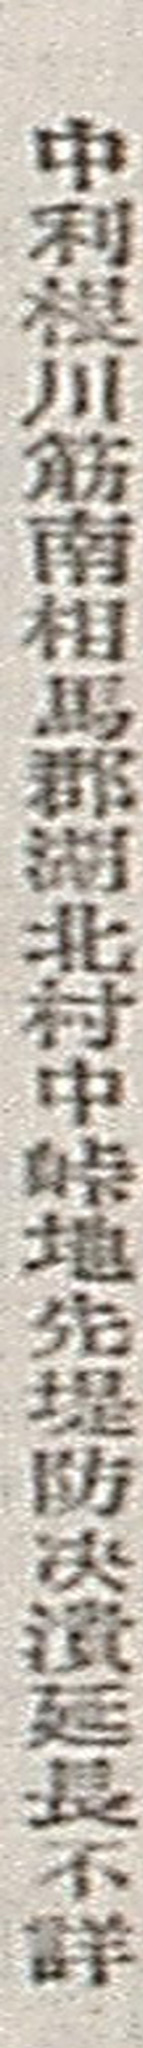中利根川筋南相馬郡湖北村中峠地先堤防决潰延長不詳
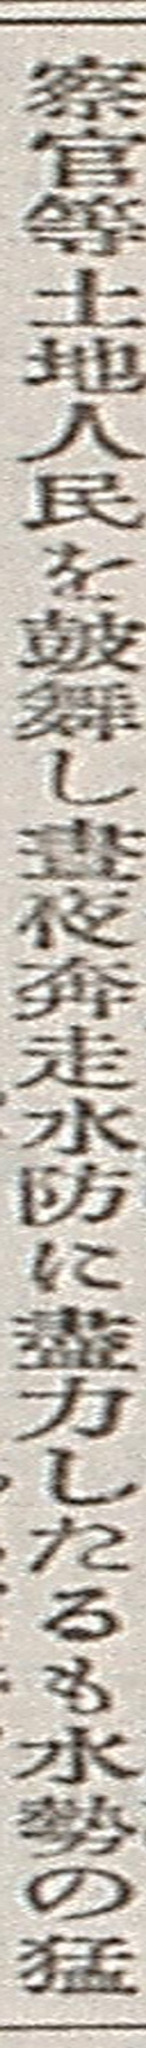察官等土地人民を鼓舞し晝夜奔走水防に尽力したるも水勢の猛
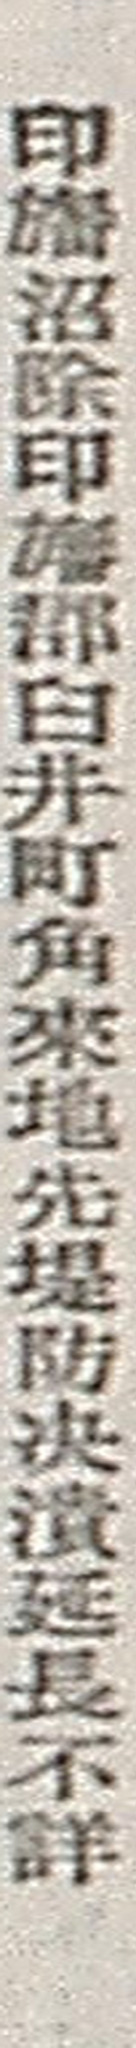印旛沼除印旛郡臼井町角來地先堤防决潰延長不詳
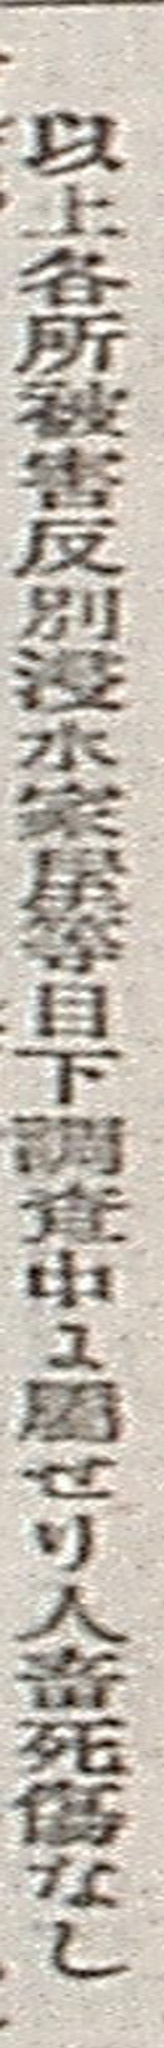以上各所被害反別浸水家屋等目下調査中に属せり人畜死傷なし
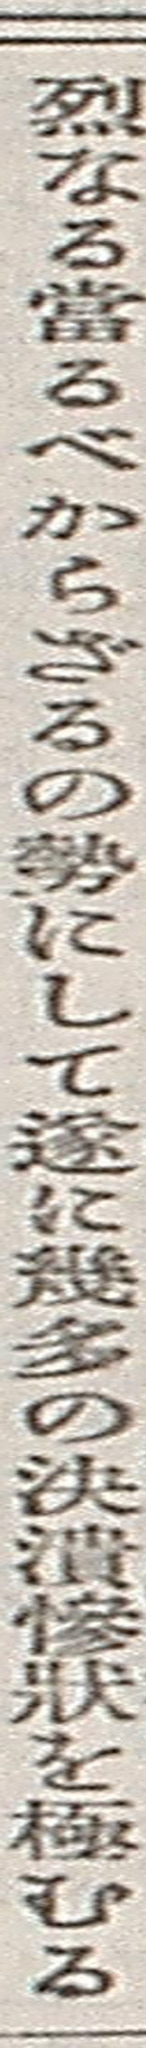烈なる当るべからざるの勢にして遂に幾多の決潰惨状を極むる
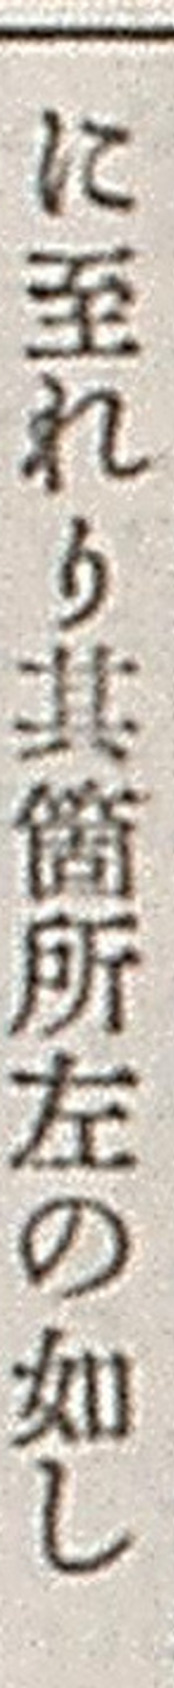に至れり其箇所左の如し
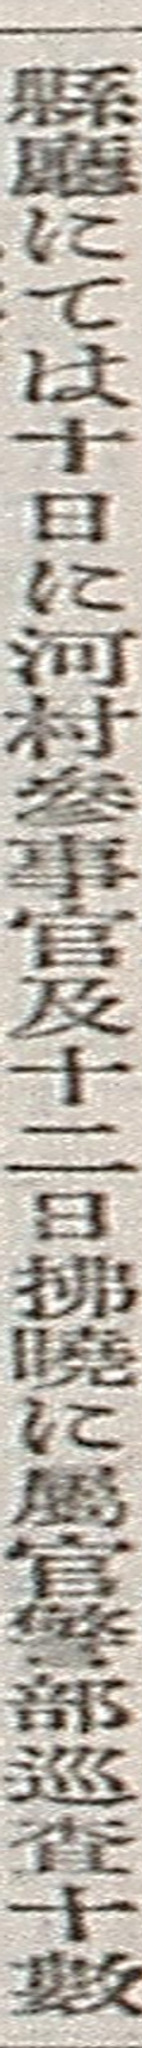県庁にては十日に河村参事官及十二日払暁に属官警部巡査十数
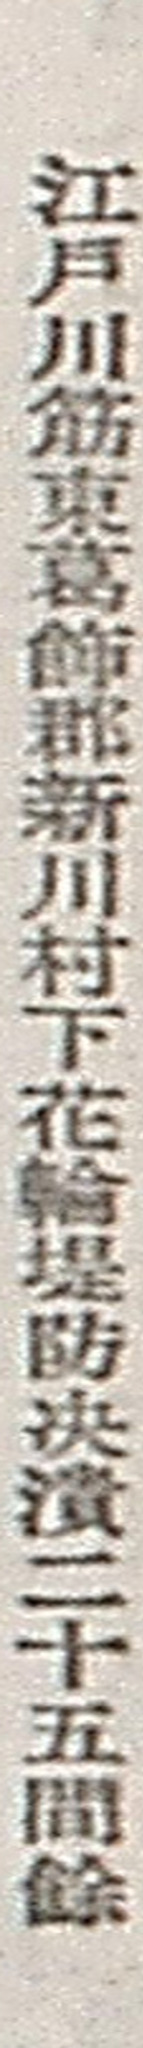江戸川筋東葛飾郡新川村下花輪堤防决潰二十五間餘
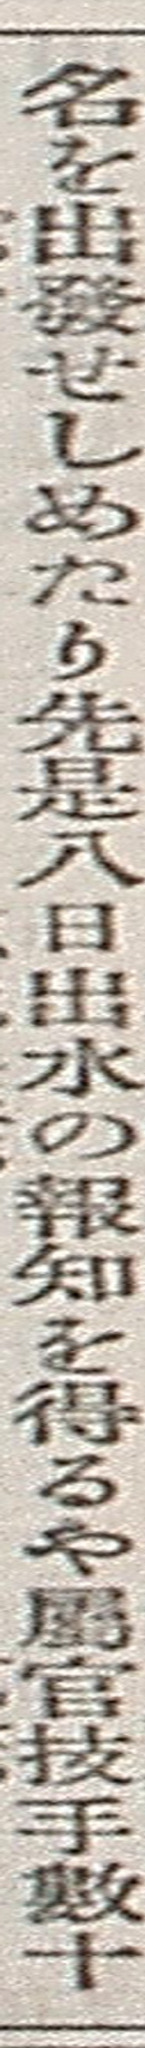名を出発せしめたり先是八日出水の報知を得るや属官技手数十
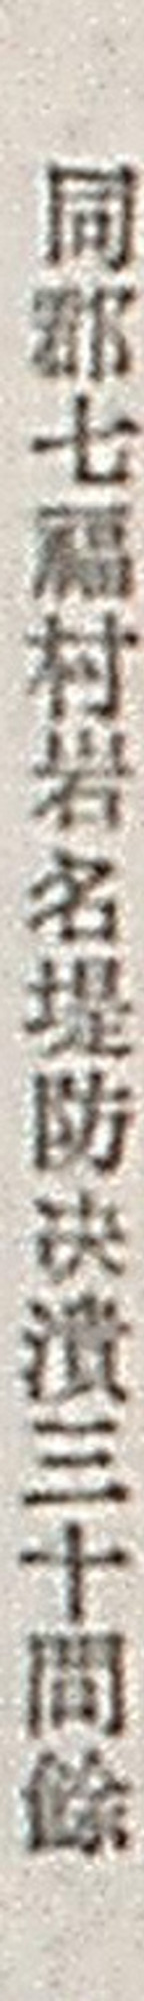同郡七福村岩名堤防决潰三十間餘
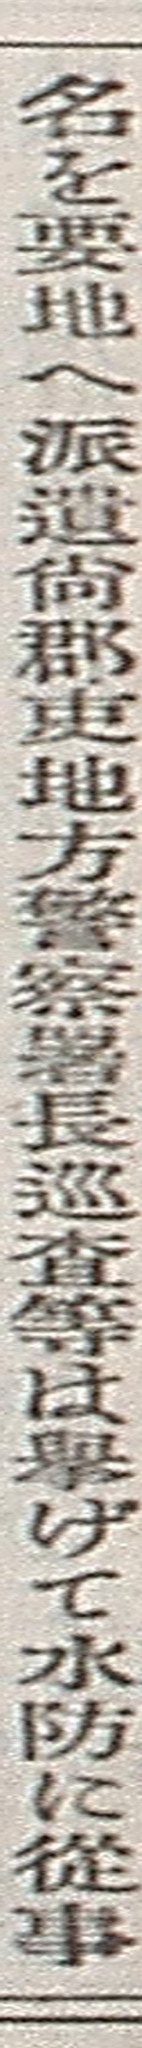名を要地へ派遣尚郡吏地方警察署長巡査等は挙げて水防に従事

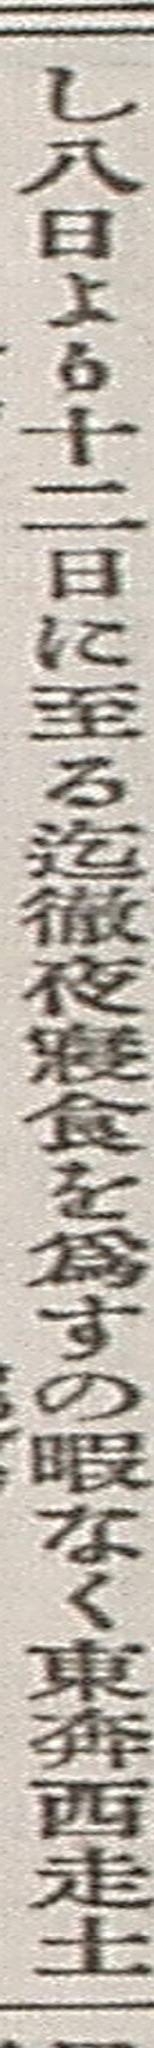し八日より十二日に至る迄徹夜寝食を為すの暇なく東奔西走土
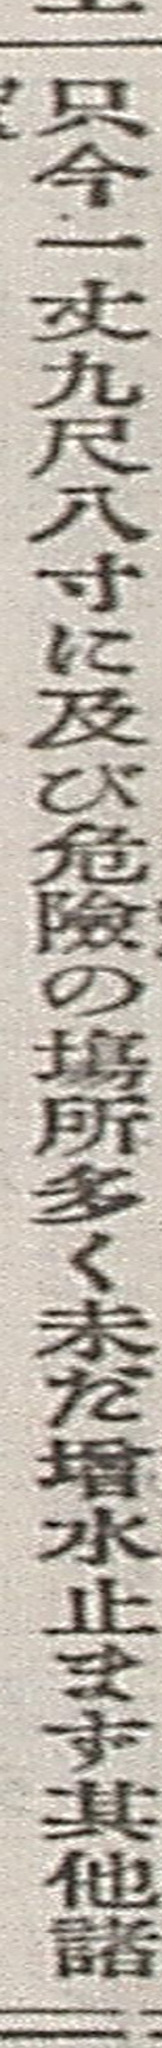只今一丈九尺八寸に及び危険の場所多く未だ増水止まず其他諸
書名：風俗畫報臨時増刊第百二十八號　洪水被害録（下）
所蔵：東京大学地震研究所図書室 Earthquake Research Institute Library, The University of Tokyo, JAPAN
